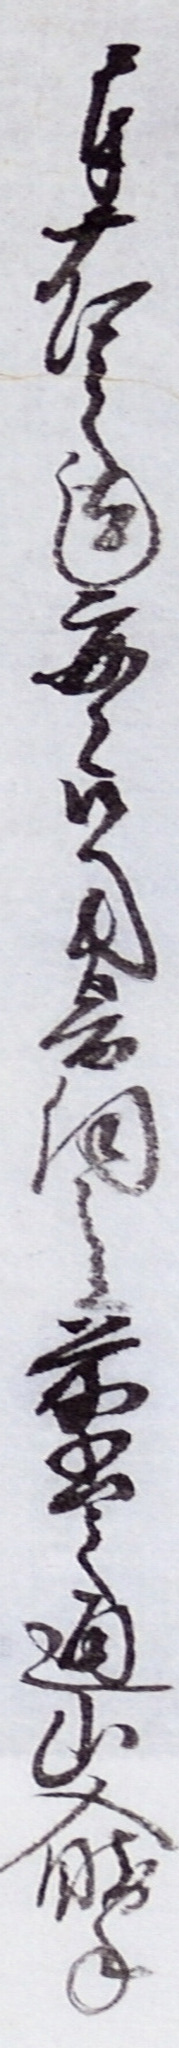ニ付右之趣毎々御用番伺之上前書之通山入勝手
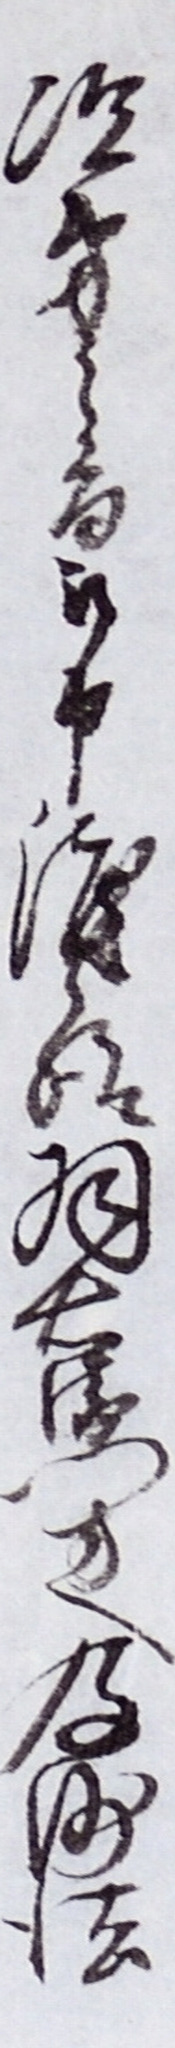次第之旨被申渡候様羽右衛門方へ及沙汰
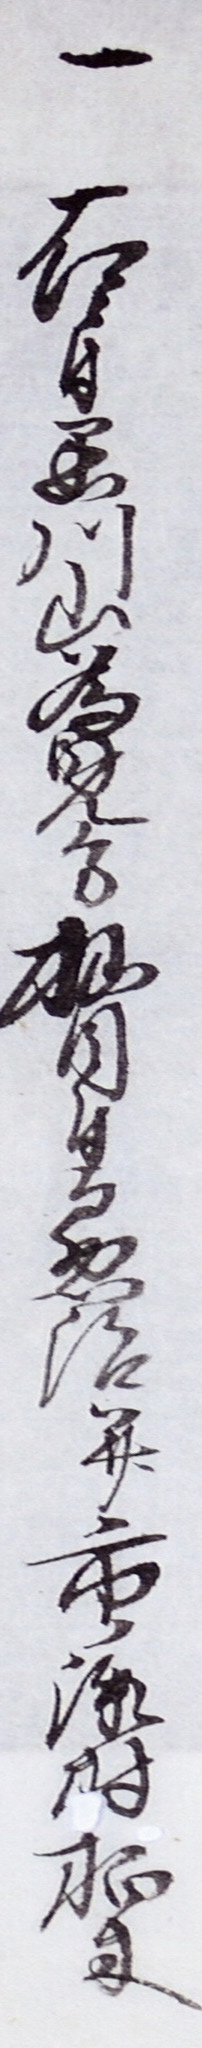一右ニ付黒川山為見分杣目付与惣治并市ヶ瀬村柏木
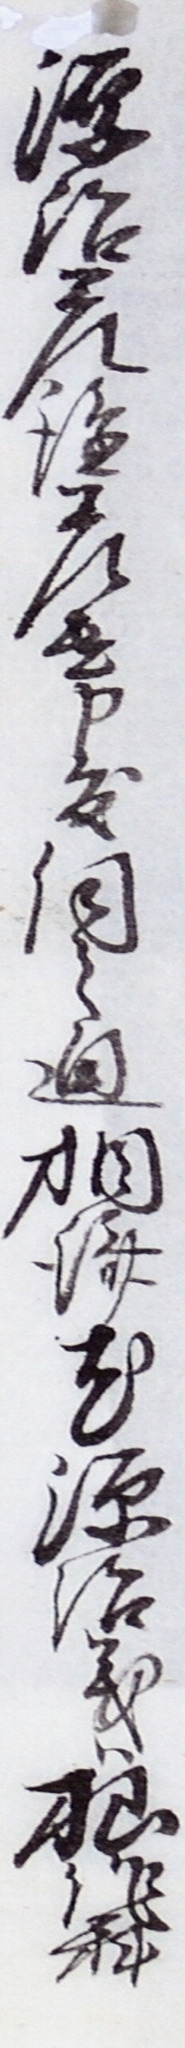源治差鐘差遣申度伺之通相済尤源治義ハ杣作料
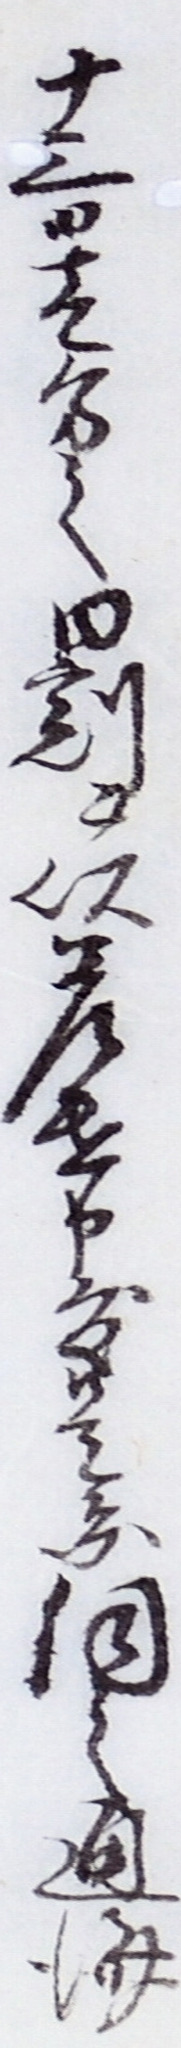十三日壱分之日割を以差遣申度候者は図伺之通済
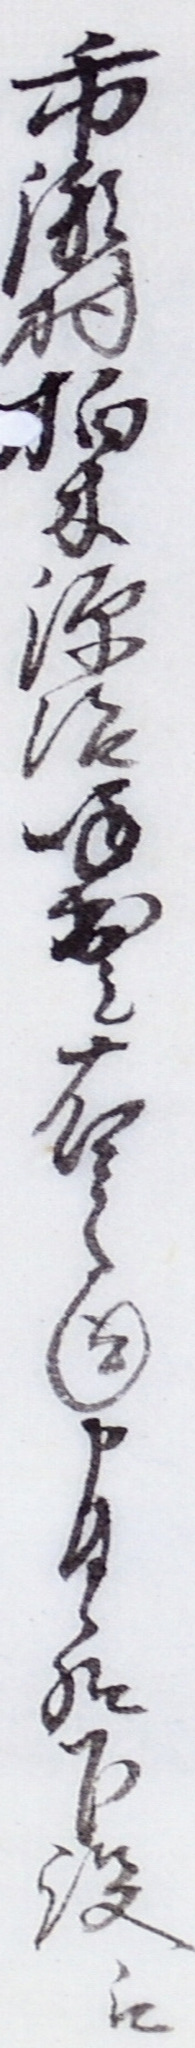一市瀬村柏木源治呼出シ右之通申付候様下役江
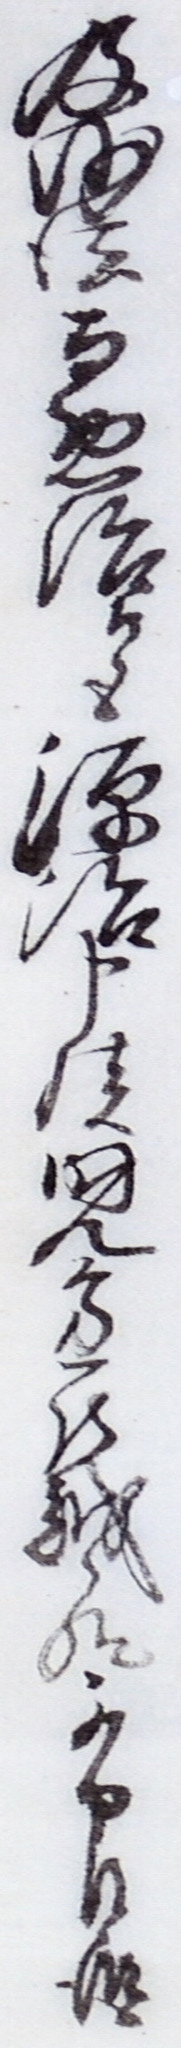及沙汰与惣治江も源治申漬見方罷越候様可申候様
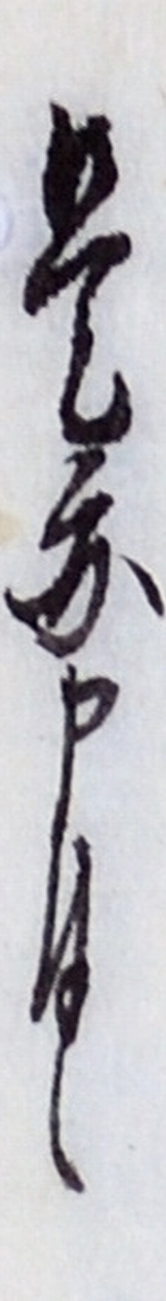是亦申付候
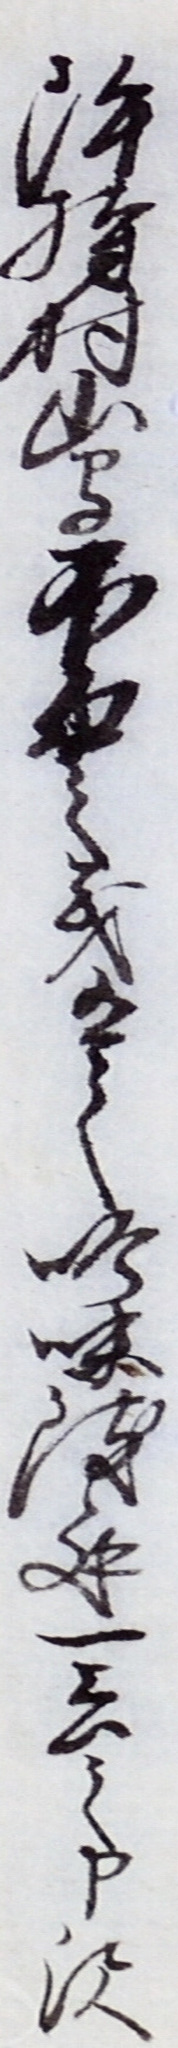一鉾持村山守不知之義有之吟味致候一言之申訳
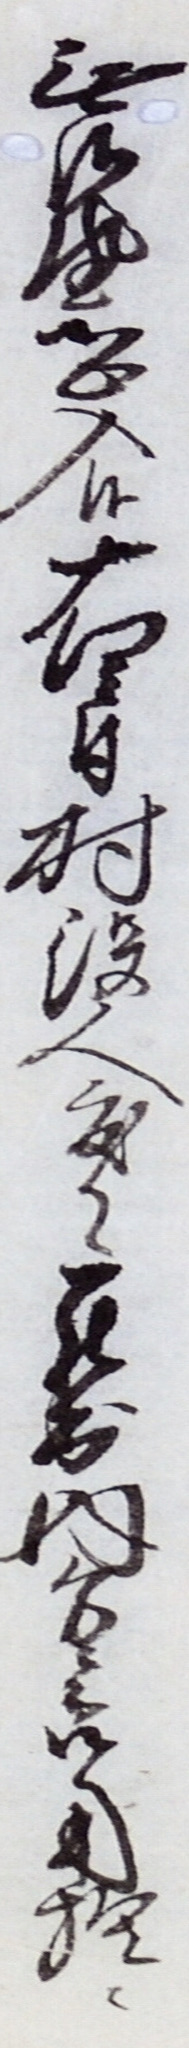無御座恐入候右ニ付村役人度々罷出内方ニ而三御用捨ニ
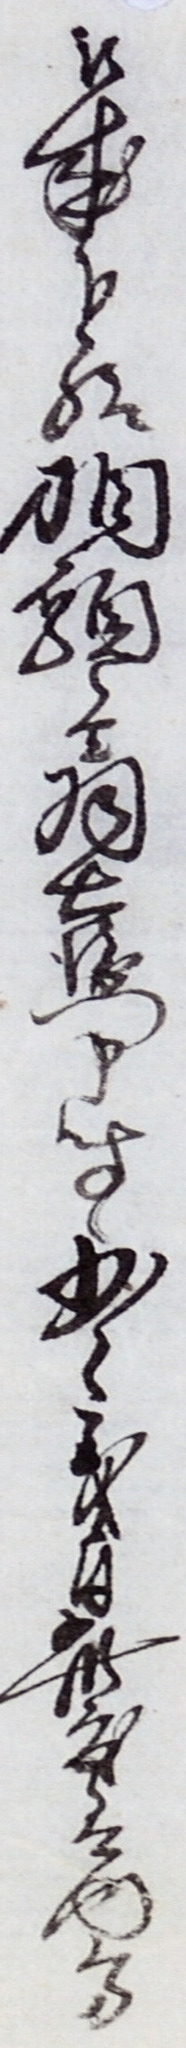被成下候様相願之上羽右衛門申聞各之義ニ付此度は伺方
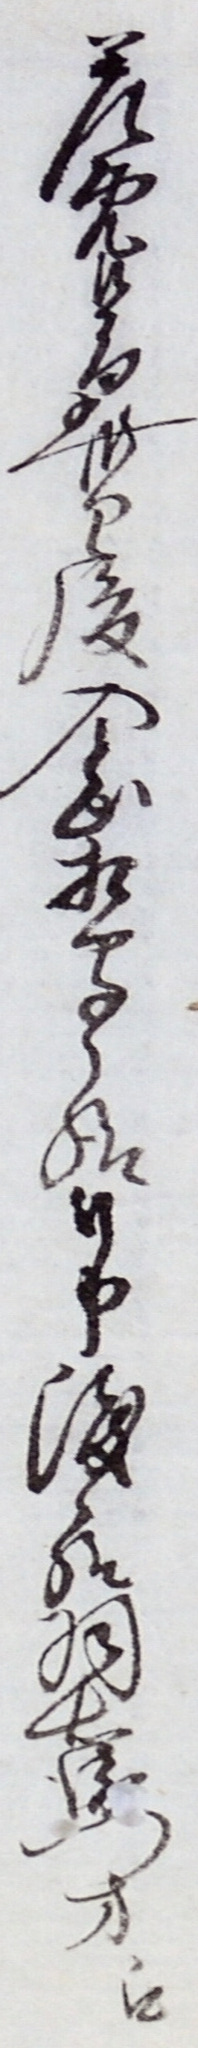差免候ニ而此里後入念相聞候様被申渡候様羽右衛門方江
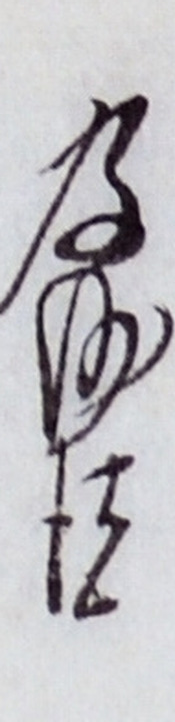及沙汰
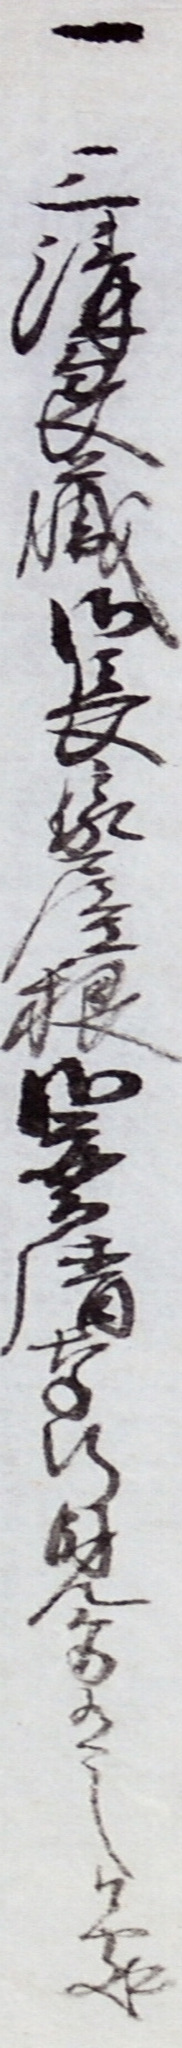一三溝良蔵御長家屋根御普請奉行見分有之候処
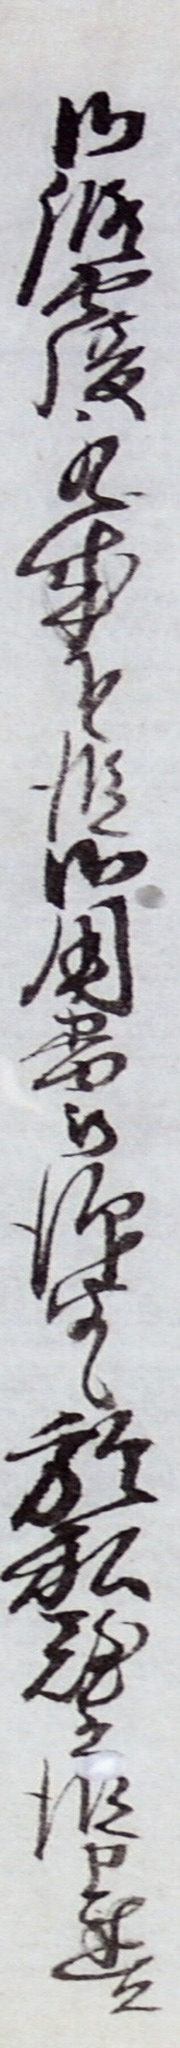御修覆罷成候様御用番被仰候於私難有段申達ス
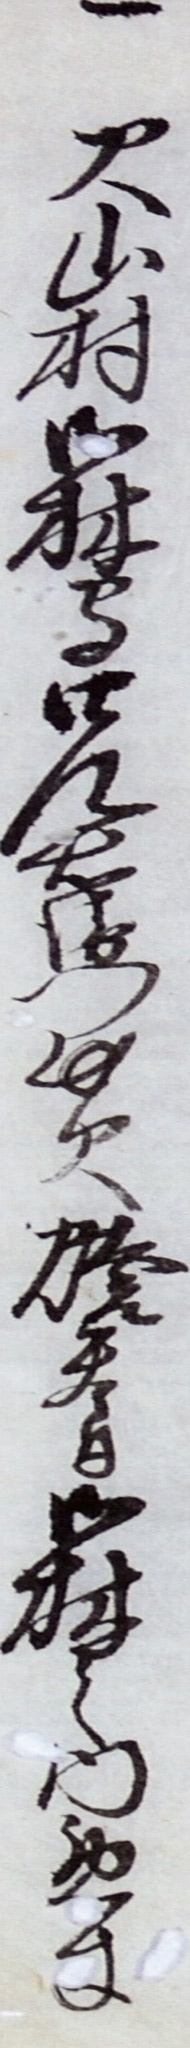一火山村御林先右衛門出火焼失ニ付御林之内惣
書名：御山奉行御用控
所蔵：伊那市立高遠町図書館・合同会社AMANE
